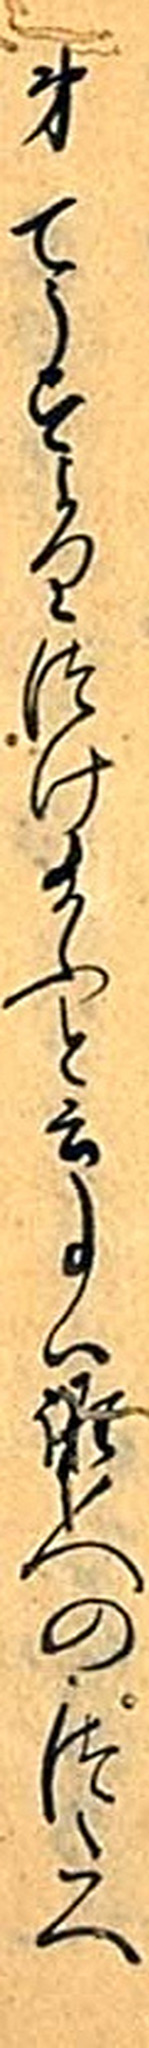弟てうすよりつけ給ふと云事は誰人のつたへ
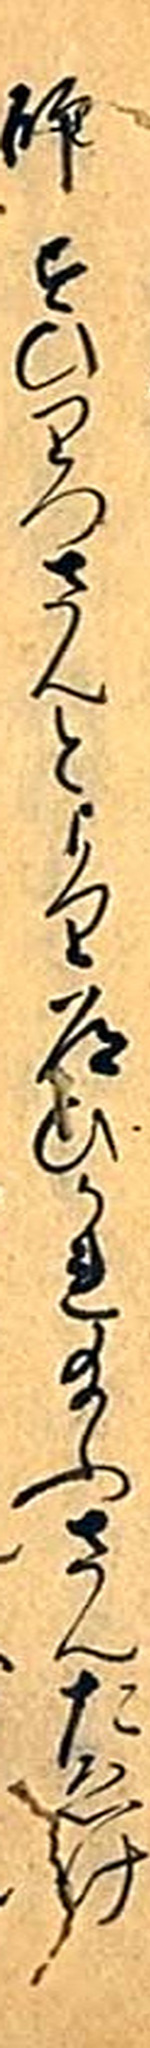師すひりつさんとより道ひかれ給ふさんたゑけ
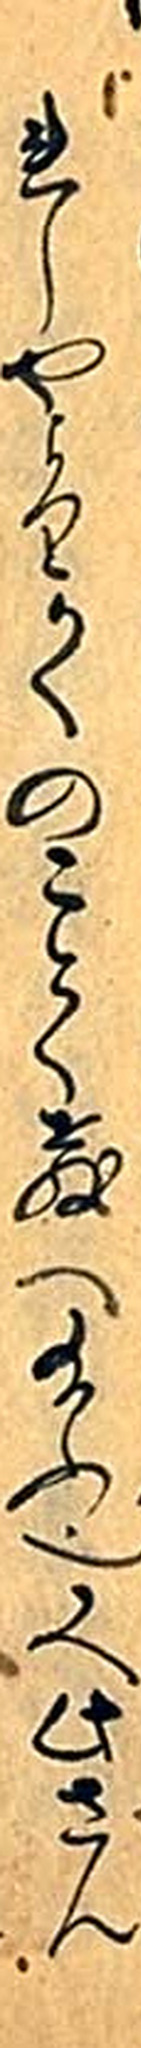れしやよりかくのことく教へ給ふ也又此さん
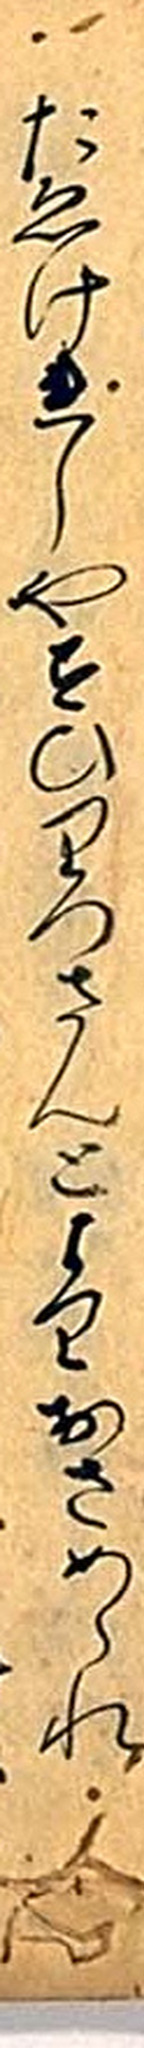たゑけれしやすひりつさんとよりおさめられ
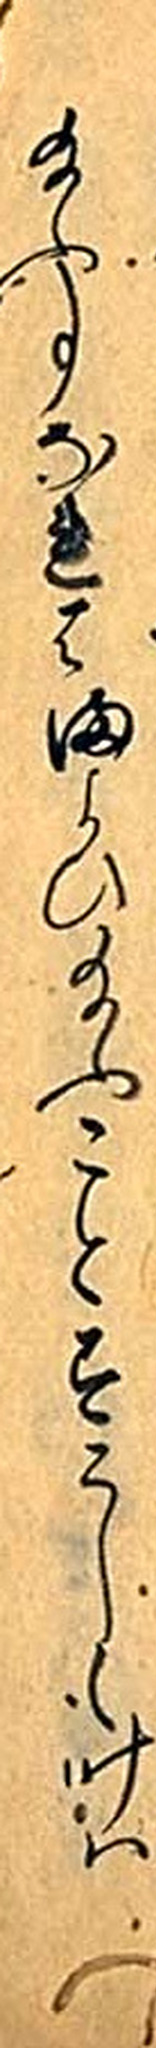給ふ事なれはまよひ給ふことすこしも叶は

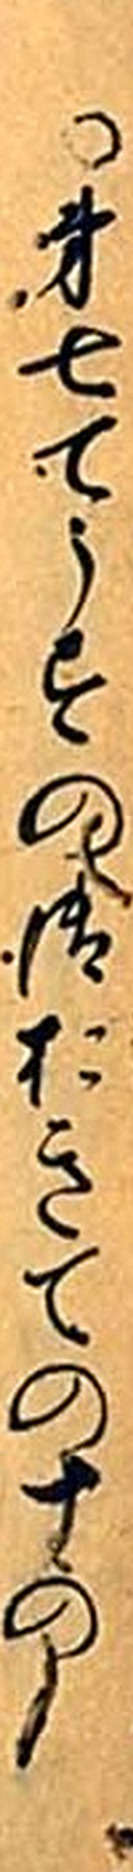○第七てうすの御おきての十の
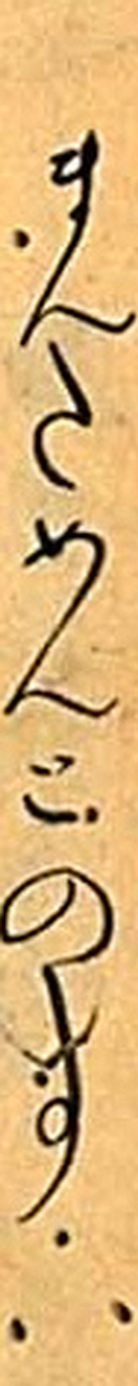まんためんとの事
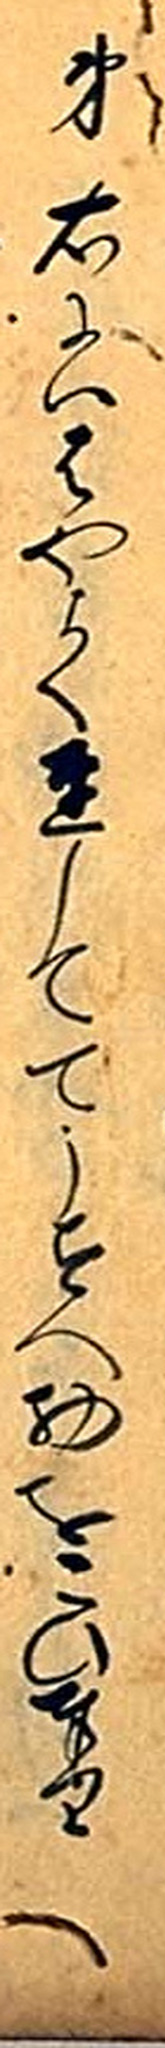弟右にははやよく達しててうすへ物をこひ奉り
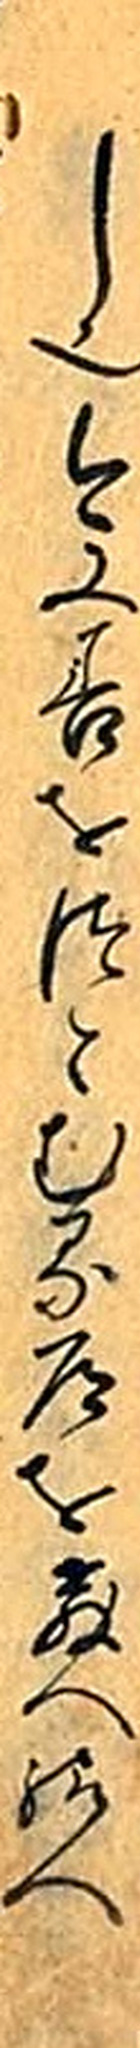し也今又善をつとむる道を教へ給へ
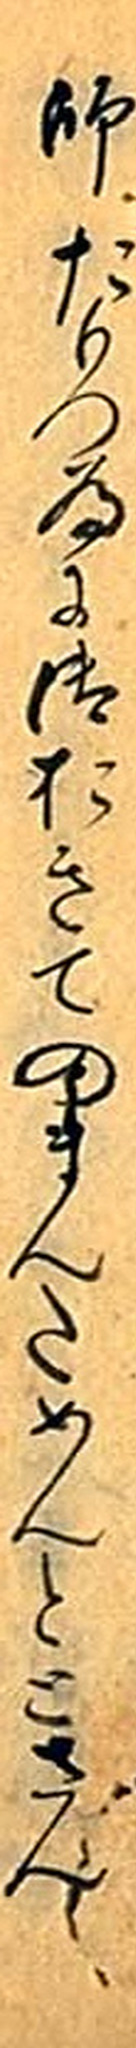師たもつ為に御おきてのまんためんととさん
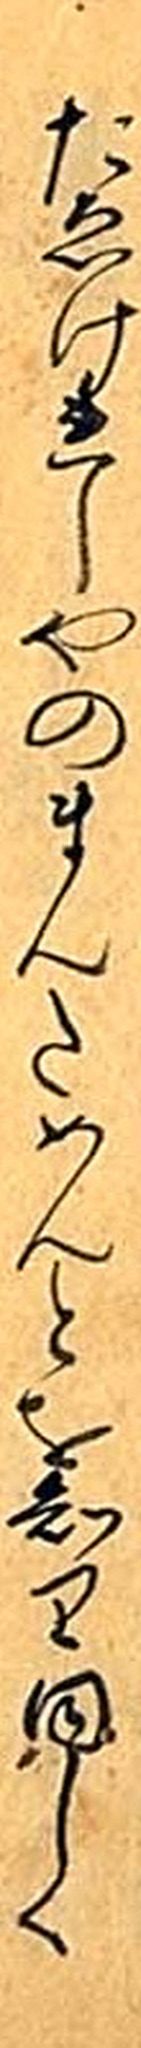たゑけれしやのまんためんとを知り同しく
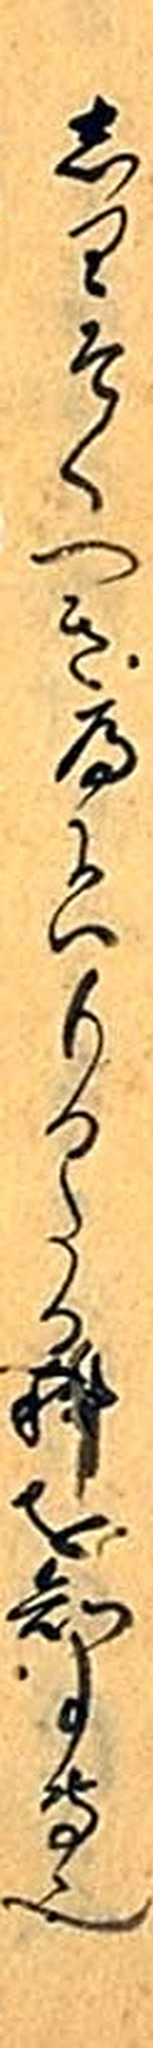しりそくへき為にはもるたる科を知事専也
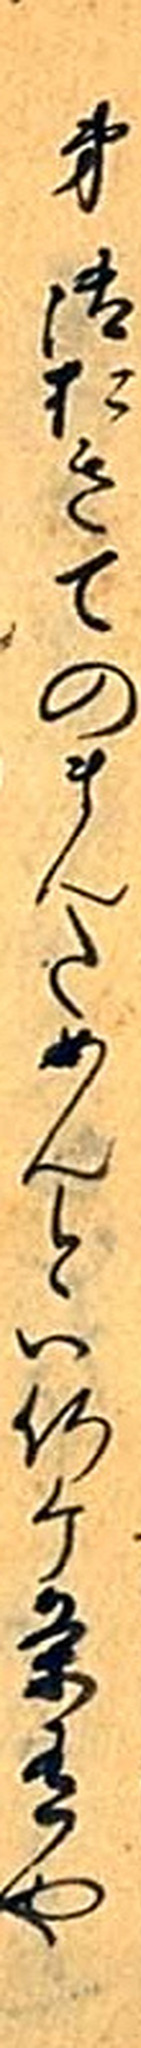弟御おきてのまんためんとは何ケ条有や
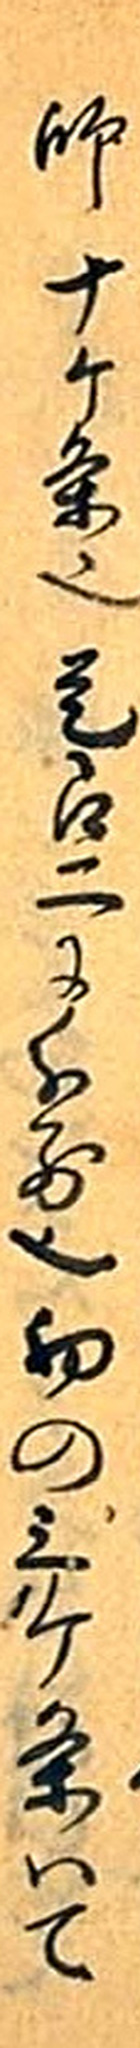師十ケ条也是即二に分別也初の三ケ条はて
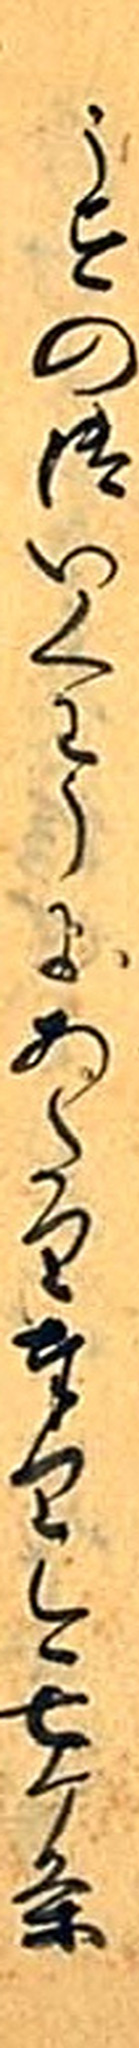うすの御いくわうにあたり奉り今七ケ条
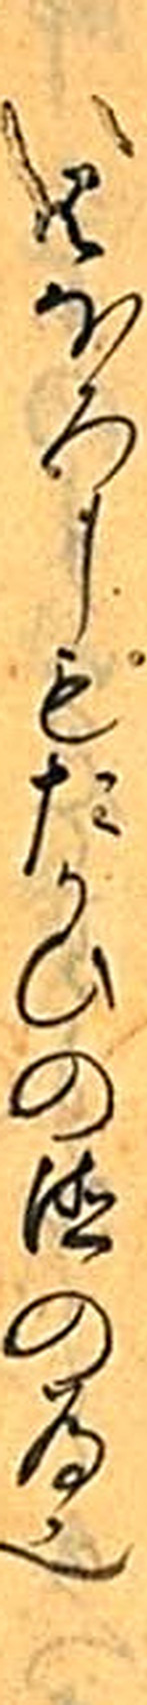はほろしもたかひの徳のため為也
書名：ドチリナ・キリシタン
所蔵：東京大学総合図書館 / General Library in the University of Tokyo
